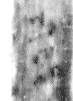生
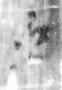才（在）
